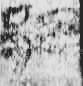郘
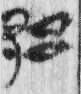郘
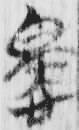懌
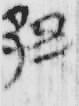郘
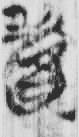壽
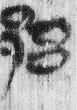郘
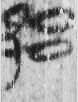郘
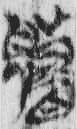瞢
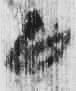㠯（以）
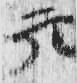亓（其）
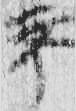不
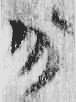分
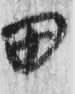田
